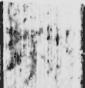○（爨）
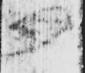月
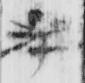未
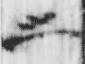之
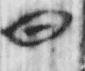日
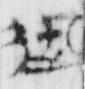○（卜）
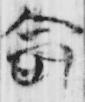命
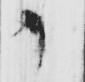人
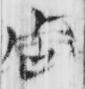周
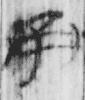甬
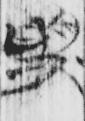受
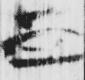正
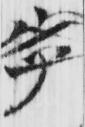李
